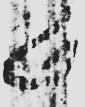㠯（以）
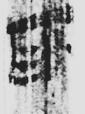爲
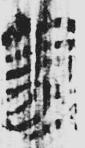義
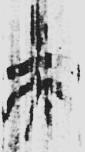夫
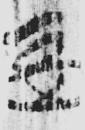是
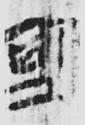則（則）
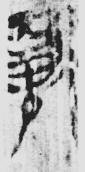獸（守）
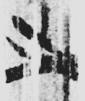之
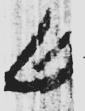㠯（以）
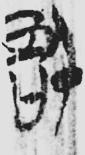○（信）
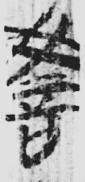○（教）
